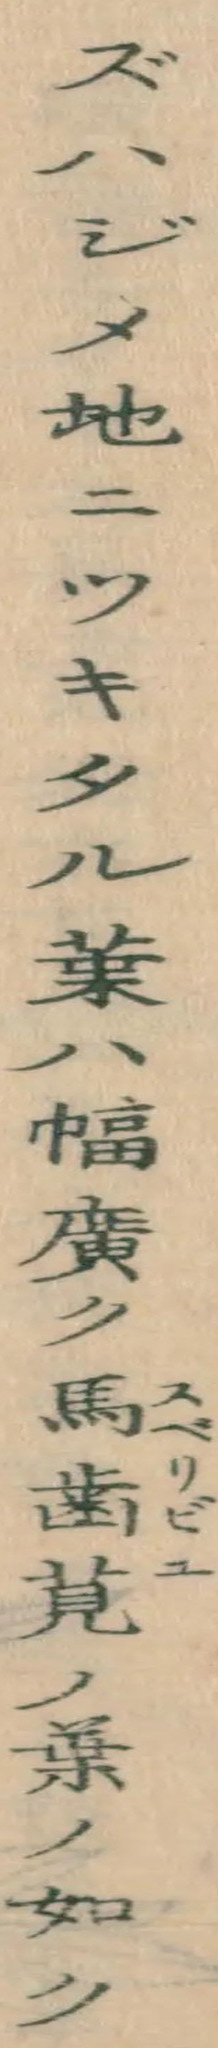ズハジメ地ニツキタル葉ハ幅広ク馬歯莧ノ葉ノ如ク
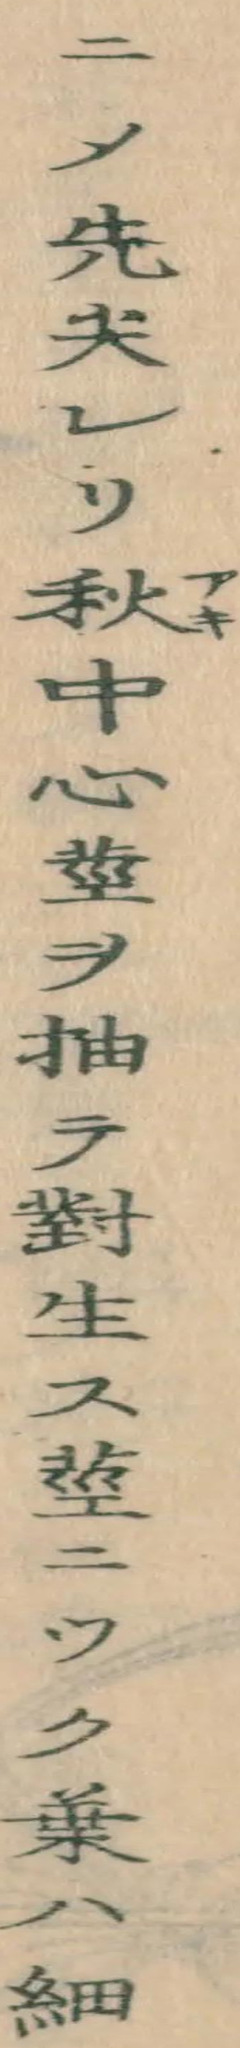ニシテ先尖レリ秋中心茎ヲ抽テ対生ス茎ニツク葉ハ細
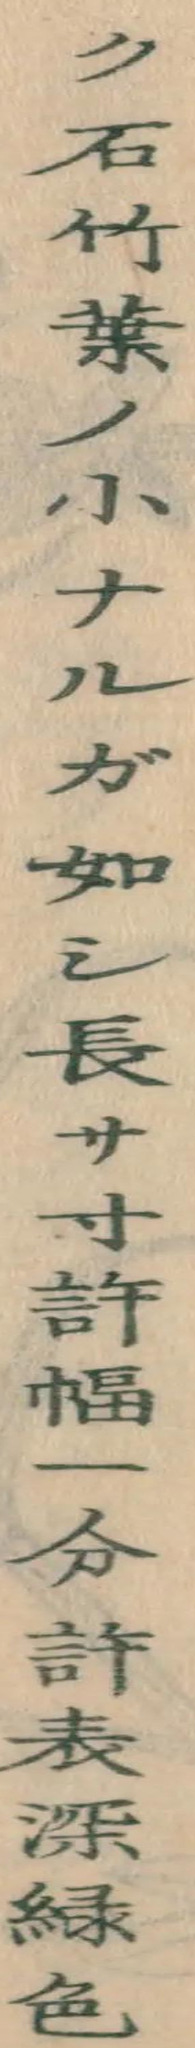ク石竹葉ノ小ナルガ如シ長サ寸許幅一分許表深緑色
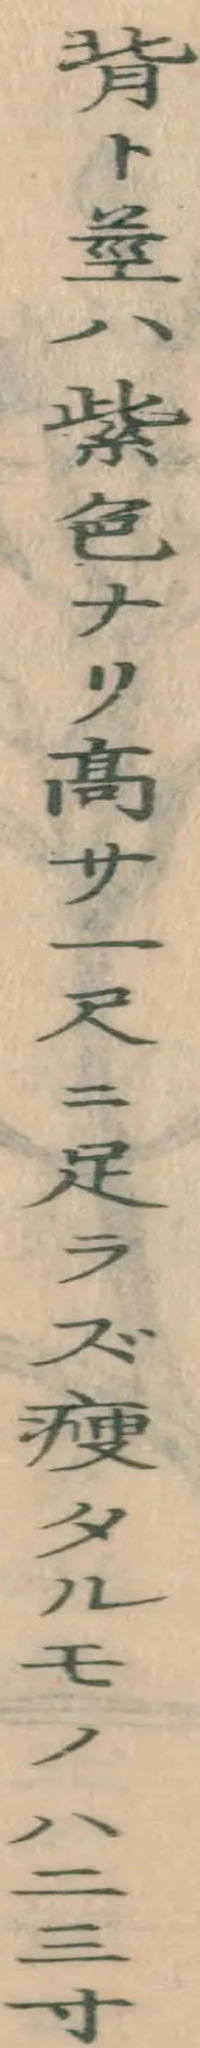背ト茎ハ紫色ナリ高サ一尺ニ足ラズ痩タルモノハ二三寸
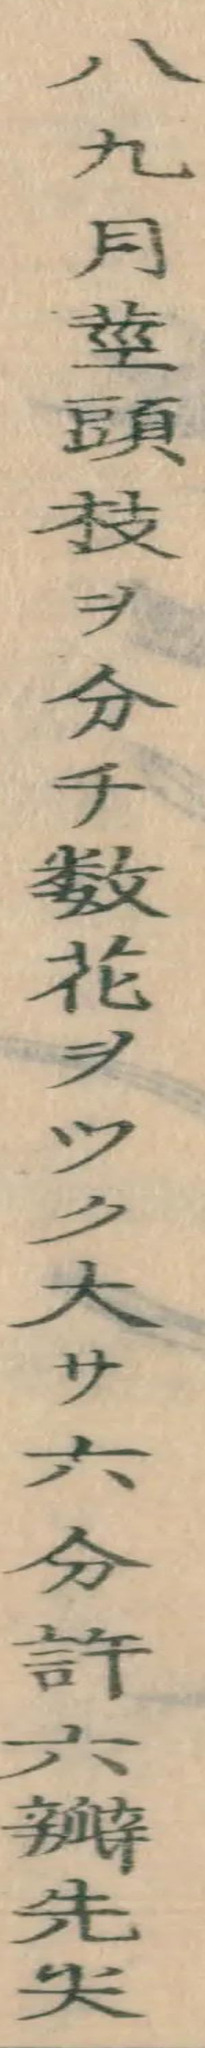八九月茎頭枝ヲ分チ数花ヲツク大サ六分許六弁先尖
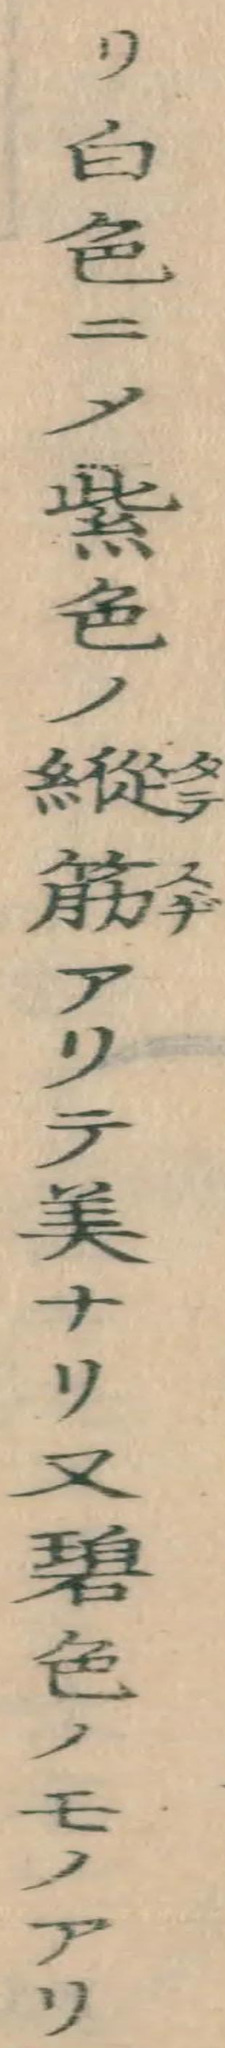リ白色ニシテ紫色ノ縦筋アリテ美ナリ又碧色ノモノアリ
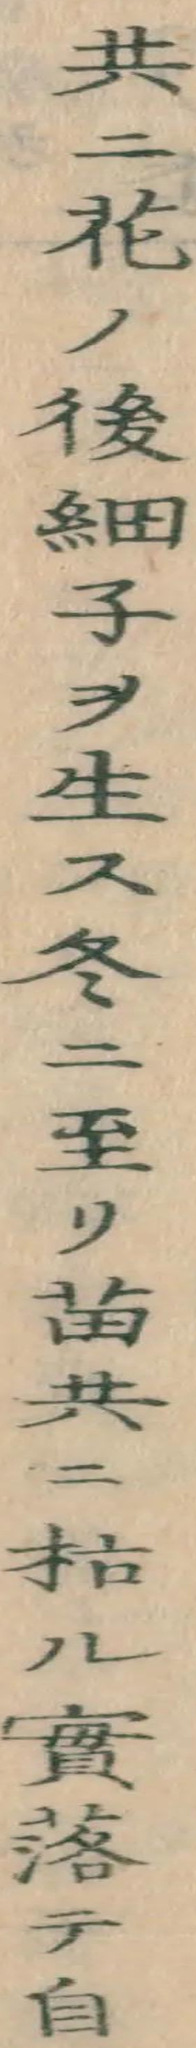共ニ花ノ後細子ヲ生ス冬ニ至リ苗共ニ枯ル実落テ自
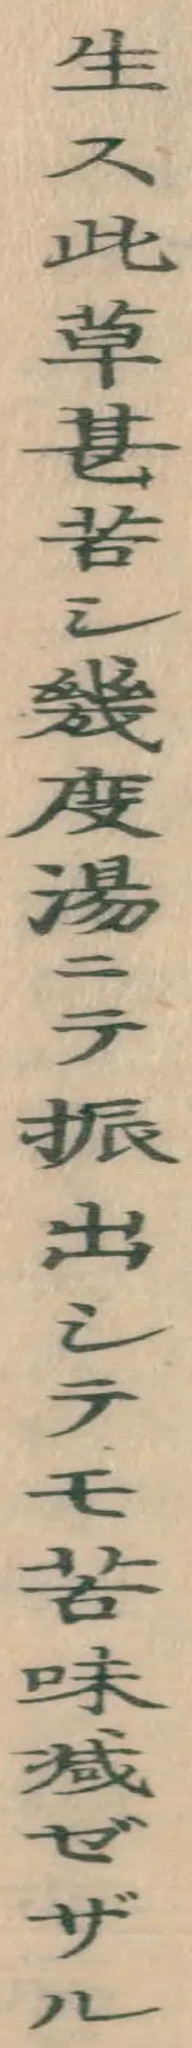生ス此草甚苦シ幾度湯ニテ振出シテモ苦味減ゼザル
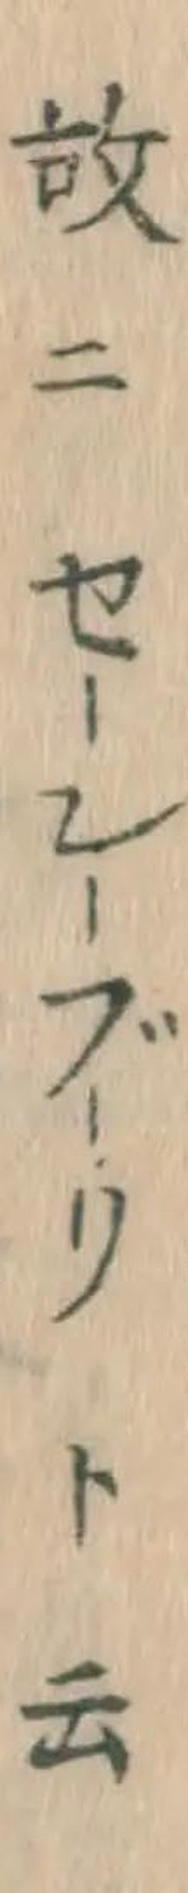故ニセ-ン-ブ-リト云
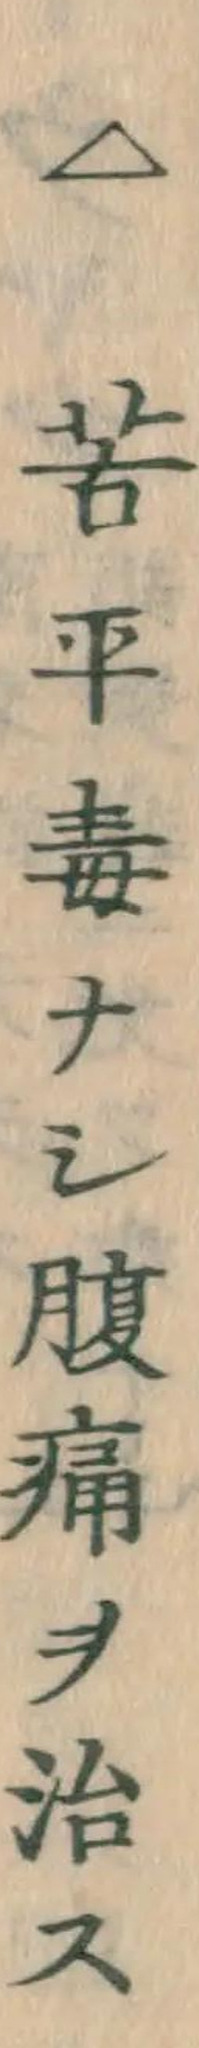△苦平毒ナシ腹痛ヲ治ス
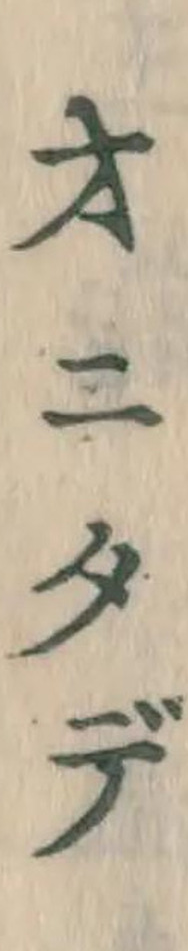オニタデ

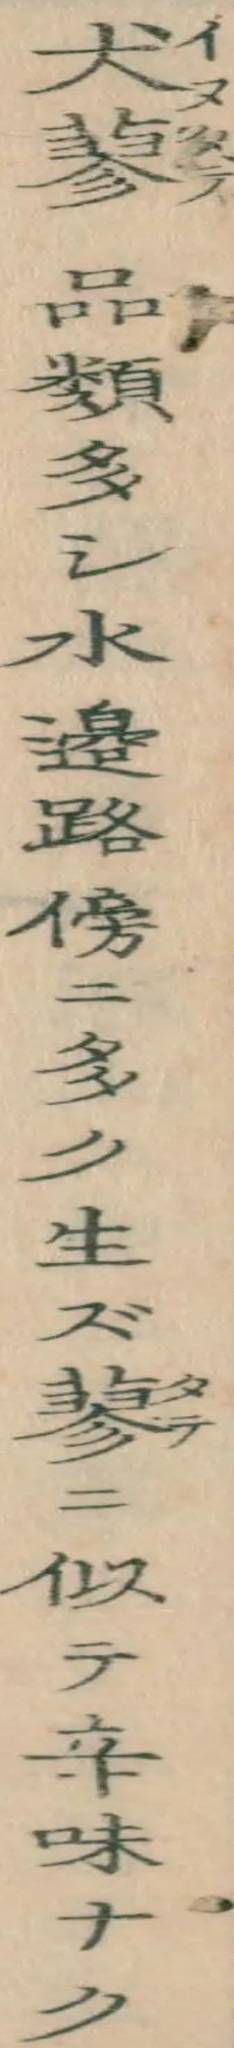犬蓼品類多シ水辺路傍ニ多ク生ズ蓼ニ似テ辛味ナク
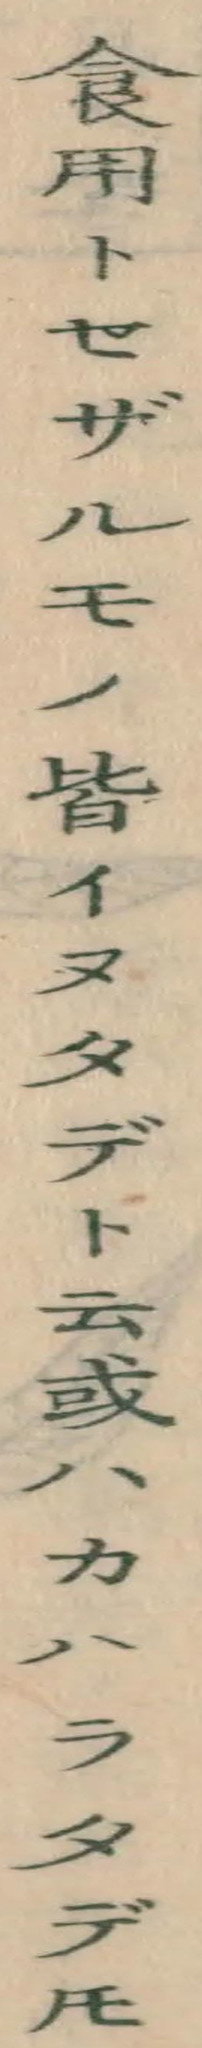食用トセザルモノ皆イヌタデト云或ハカハラタデトモ
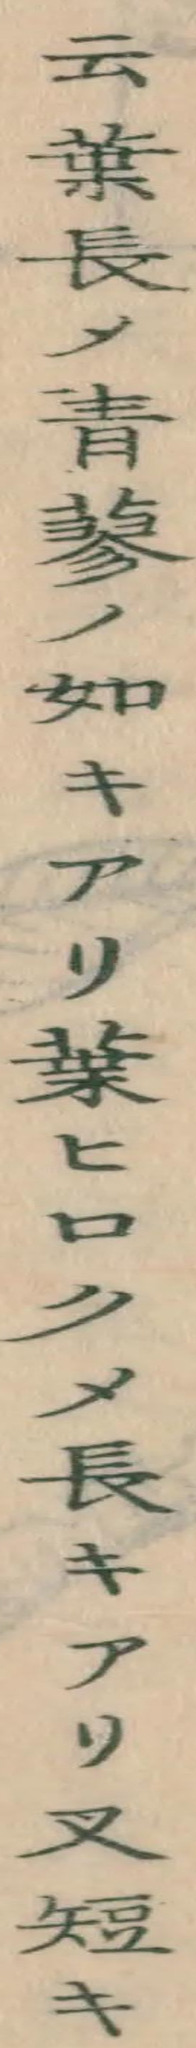云葉長シテ青蓼ノ如キアリ葉ヒロクシテ長キアリ叉短キ
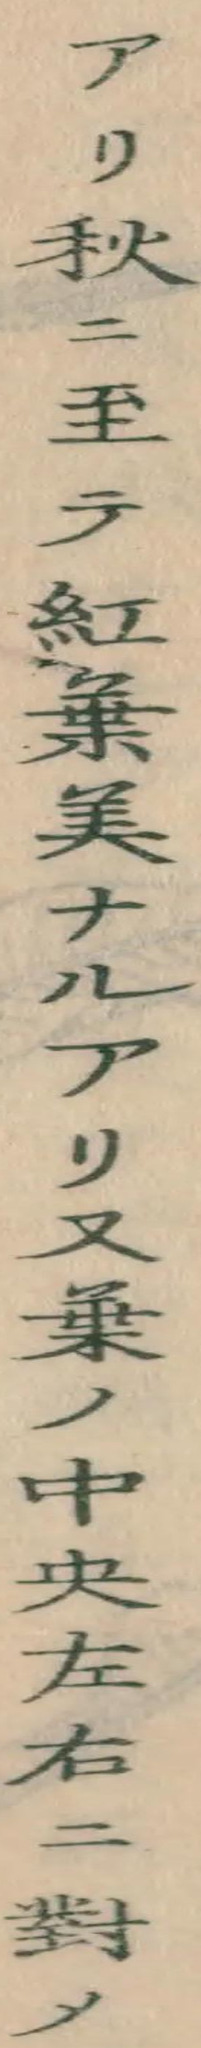アリ秋ニ至テ紅葉美ナルアリ又葉ノ中央左右ニ対シテ
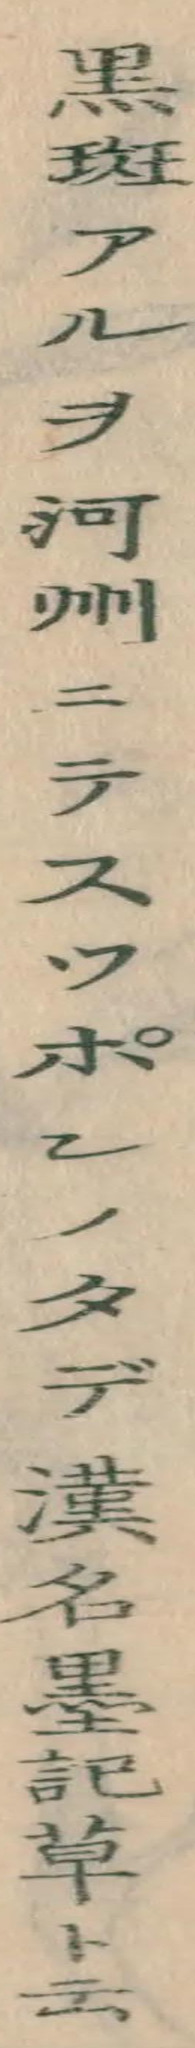黒斑アルヲ河州ニテスツポンノタデ漢名墨記草ト云
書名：これこれ草 2巻. [2]
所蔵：国立国会図書館 National Diet Library, JAPAN
